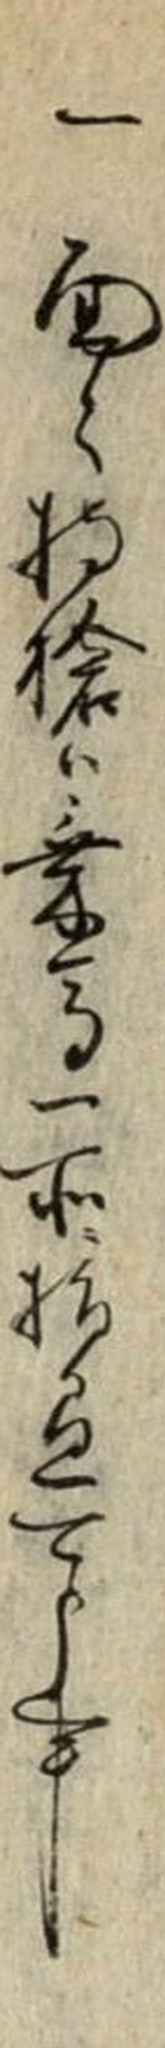一面々持槍は乗馬一所に指置可申事
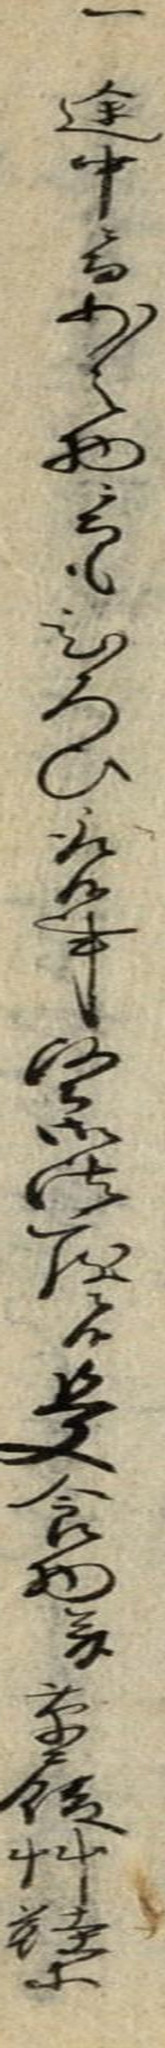一途中にて少之物にてもひろひ取候事堅御法度に候且又食物并草履草鞋等
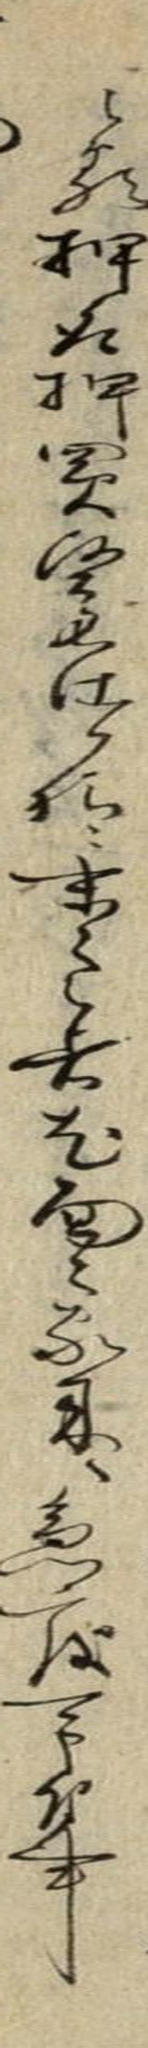之類押取押買堅不仕候様末々之者尤面々家来へ急度可申付事
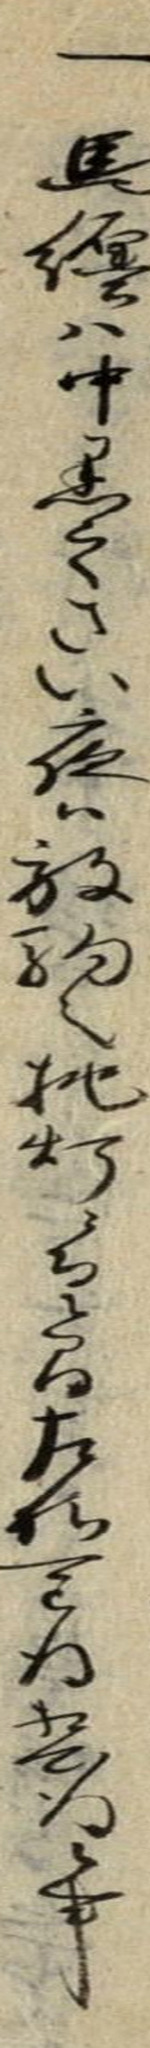一馬纏は中黒之さい夜は放駒之挑灯にて候間左様可被得相心得候事
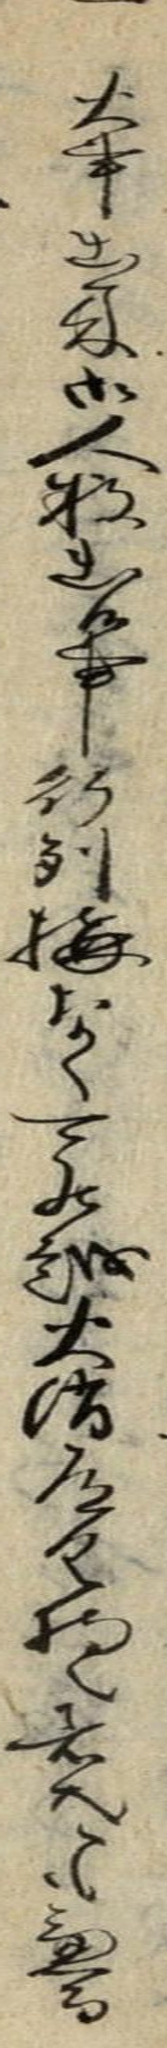一火事出来御人数出候事行列構なく可罷越火消道具持之者共へも兼て
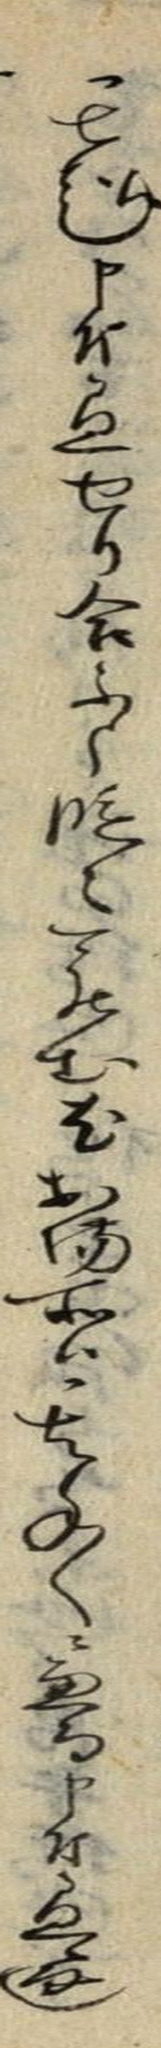其趣申付置せり合不申段々可罷出尤於場所は其手〳〵に兼て申付置候通
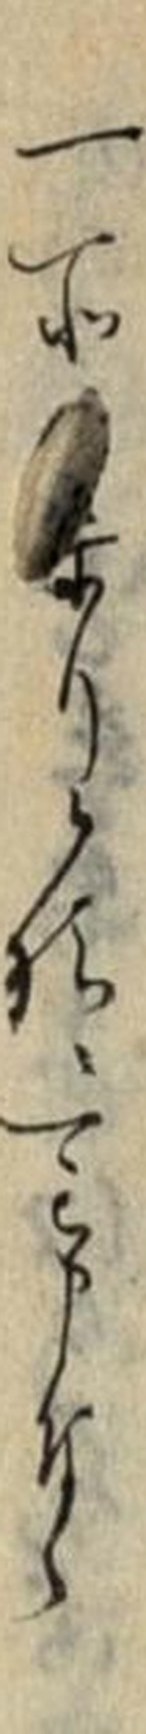一所り候様に可被申付候
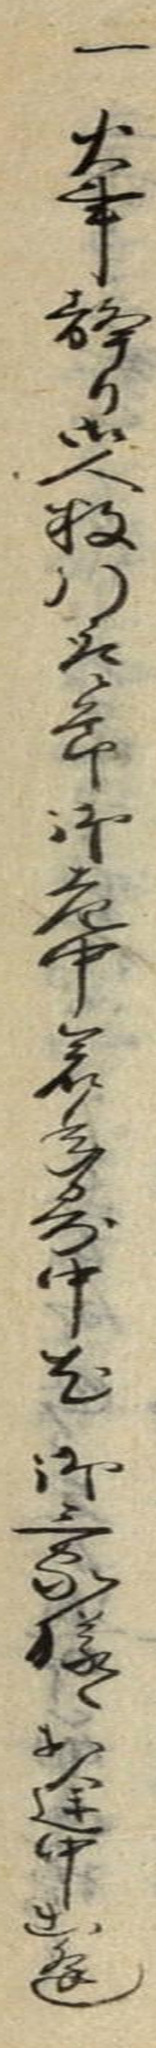一火事静り御人数引取候節御老中若年寄中尤御三家様へ於途中出逢
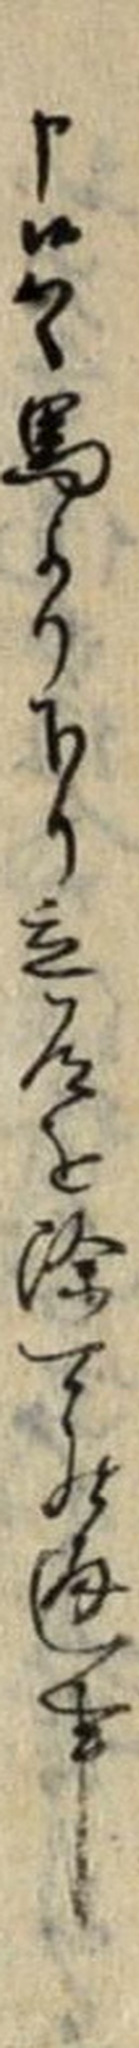申候はゝ馬より下り立道を除け可罷通事
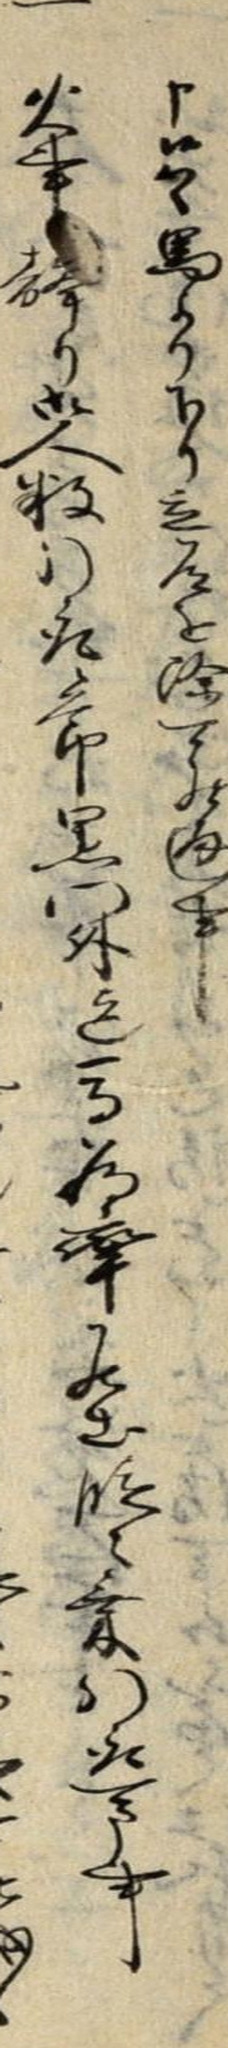一火事静り御人数引取候節黒門外迄馬為牽罷出段々乗引取可申事
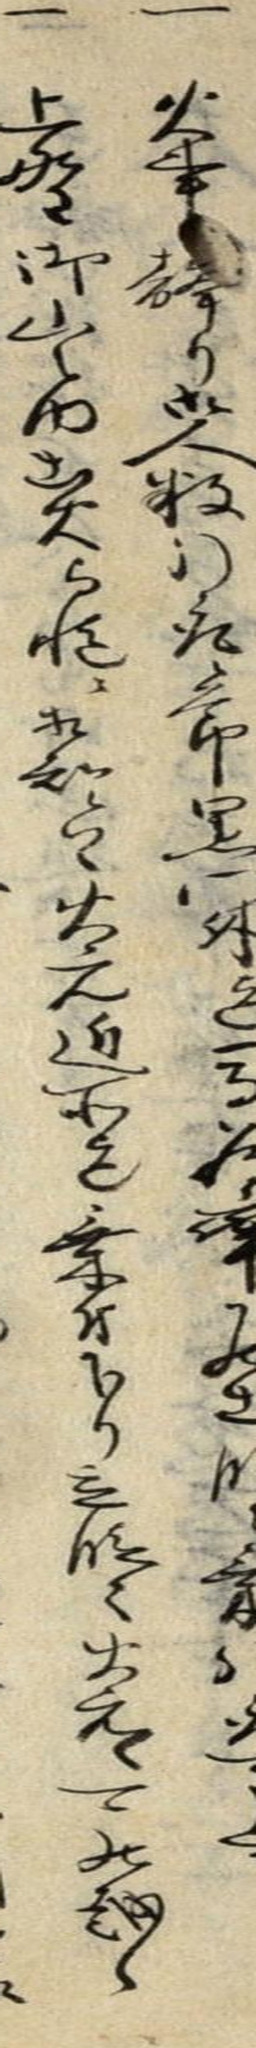一上野御山之内出火と慥に相知候はゝ火元近所迄乗付下り立段々火元へ可罷越候
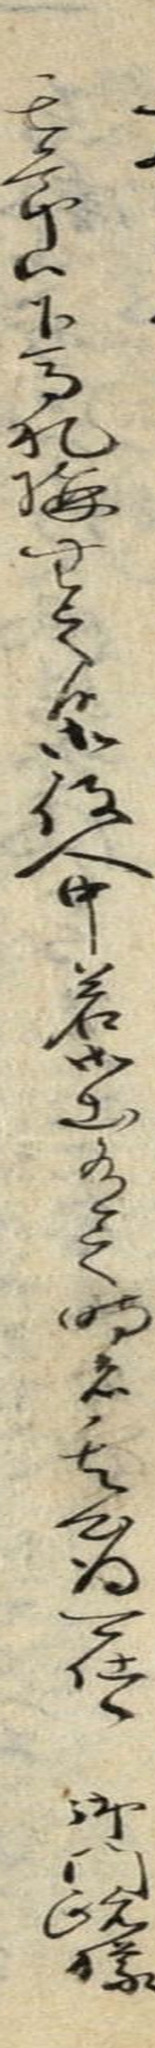其節は下馬札構無之候御役人中若御出有之時は其心得可仕候御門跡様
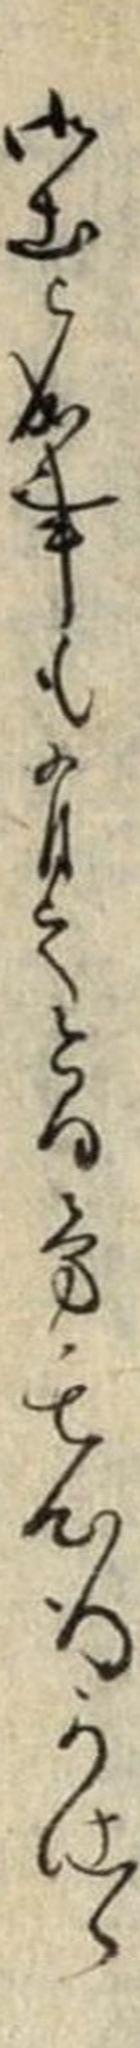御出被成事も有之候間旁其心得可仕候
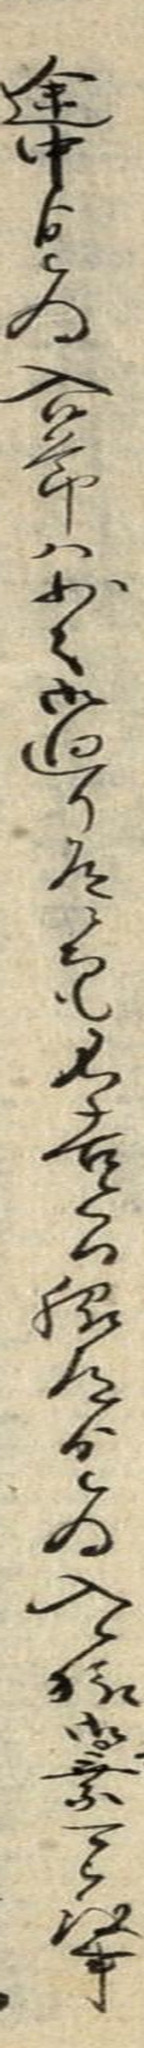一途中ゟ被為入候節は少々御廻り道にても不苦候間脇道ゟ被為入候様御先か乗可被致事
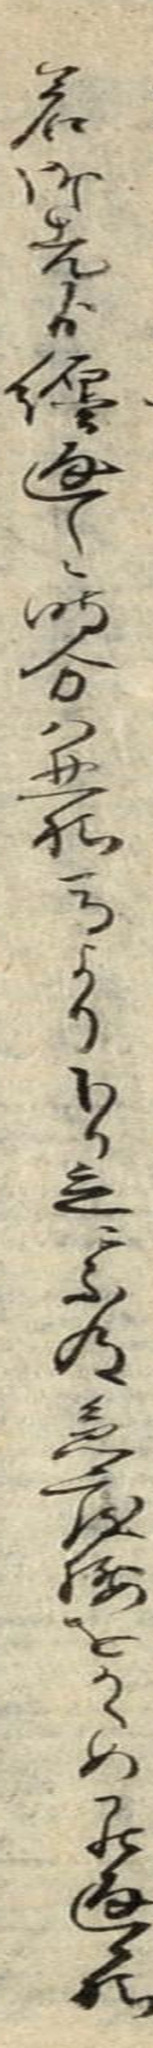若御先ゟ纏通し候時分は惣様馬より下り立に不及急度腰をかゝめ罷通候様
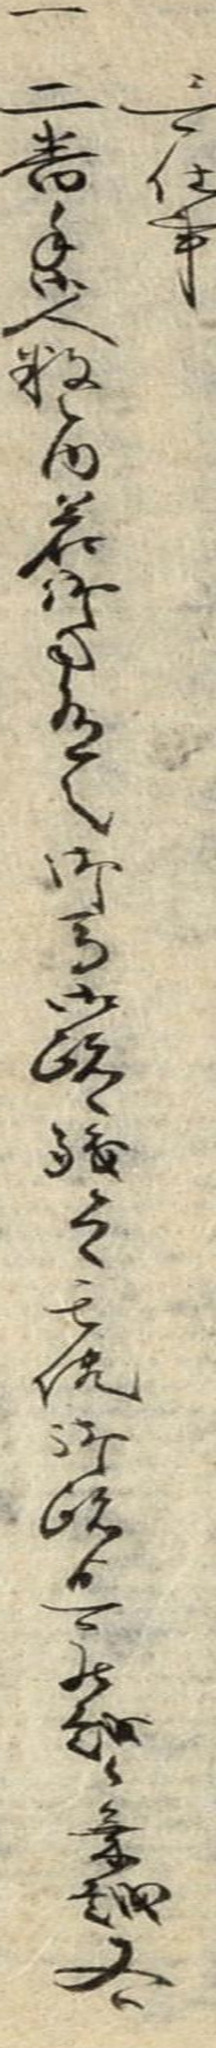一二番手御人数之内若御用有之御馬御跡へ残候はゝ其供御跡ゟ可罷越候乗越又は
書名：三都并道中之部
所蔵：福井県文書館 Fukui Prefectural Archives
